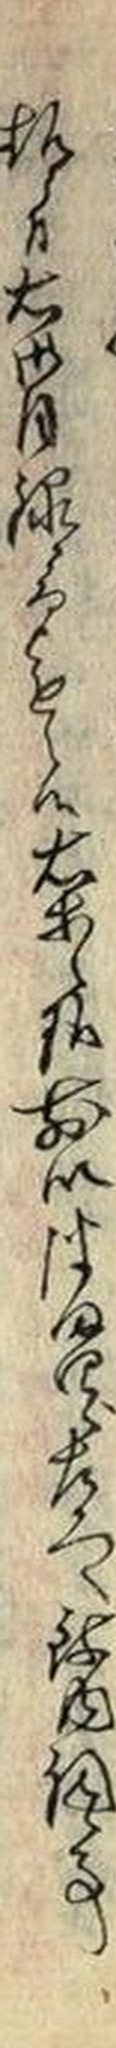趣ニ付右御目録ニ而被進之候右等之趣前以津田四郎左衛門へ致内調候事
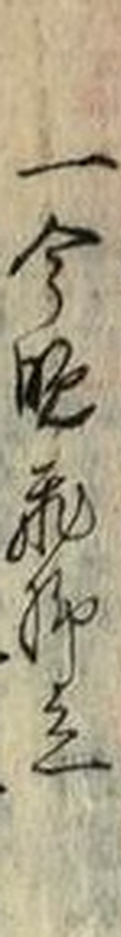一今晩飛脚立
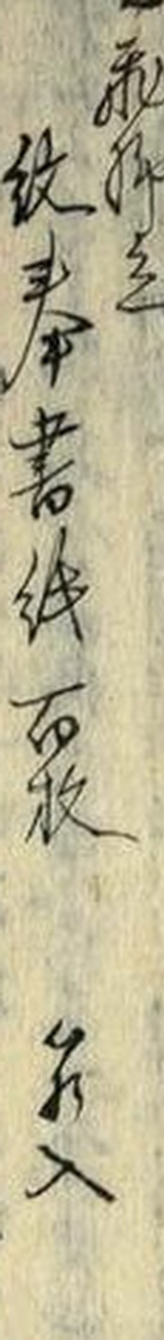紋奉書紙百枚箱入
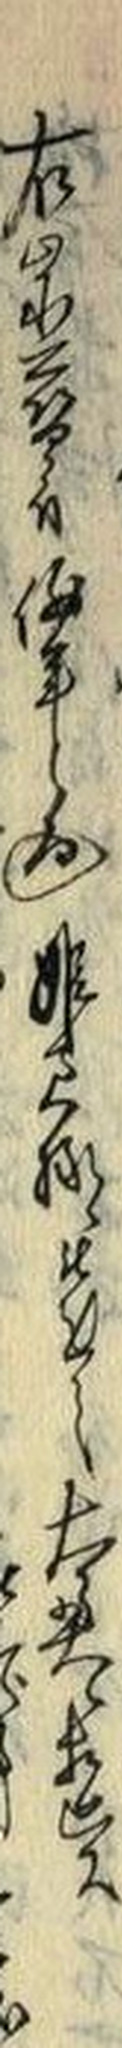右歳暮ニ付例年之通姫君様へ被進之大奥へ相回ス
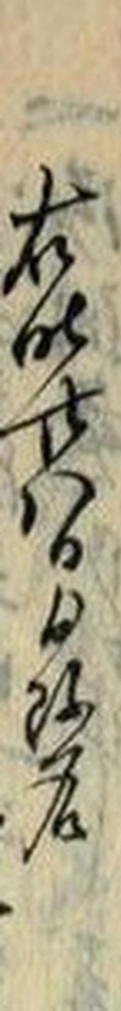右昨廿八日ゟ改名
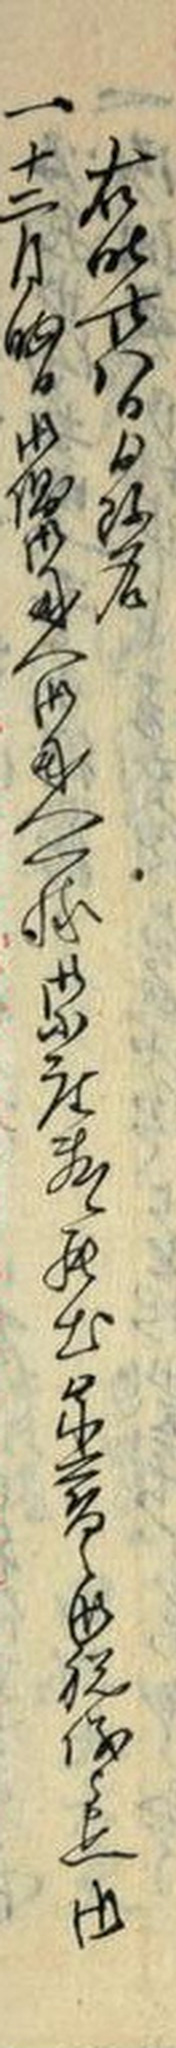一十二月晦日御側御用人御用人一統御小座敷へ罷出歳暮之御祝儀被申上御
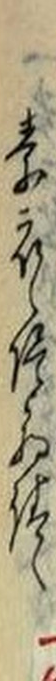素衣之儘被為請候
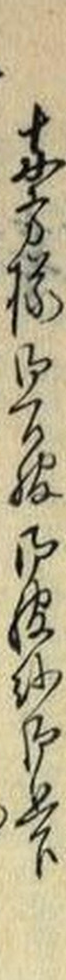両方様御召服御服紗御上下
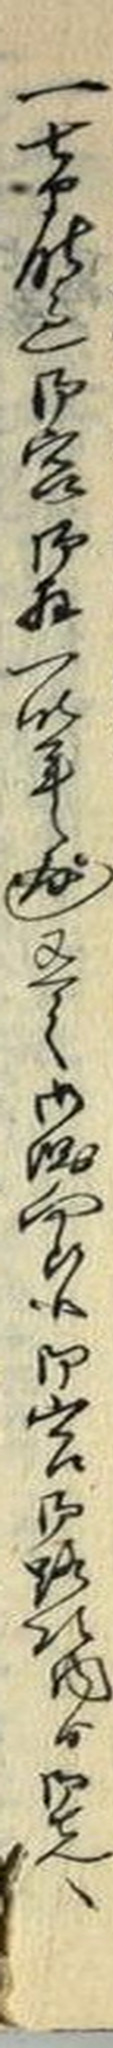一七半時過御宮御拝一昨年之通有之御側向頭取御宮御路次内ゟ御先へ
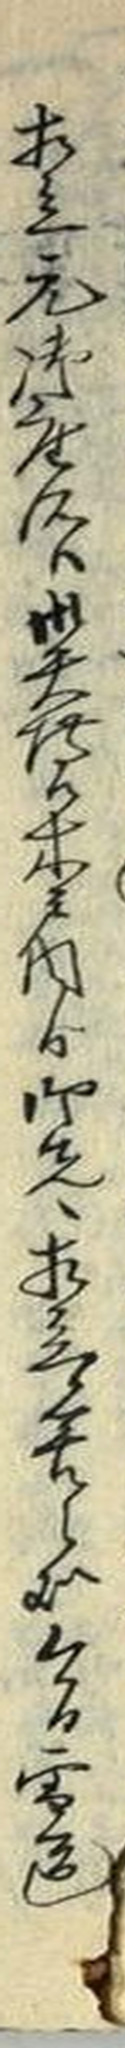相立元御座所ハ御矢場口木之内ゟ御先へ相立候筈之処今日雪道
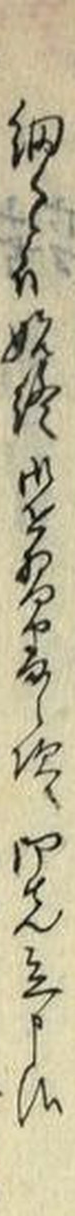細く候ニ付始終御近習番之次ニ御先立申候
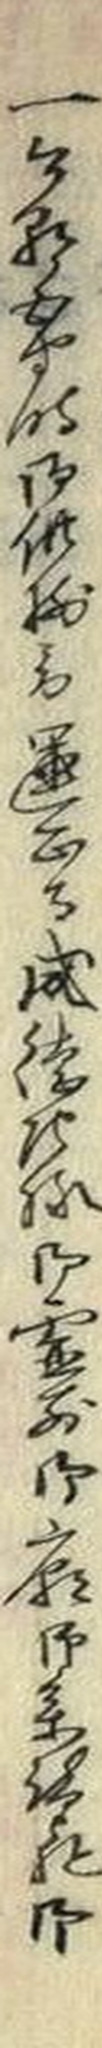一今朝五半時御供揃ニ而運正寺威徳院様御霊前御廟御参詣被遊御
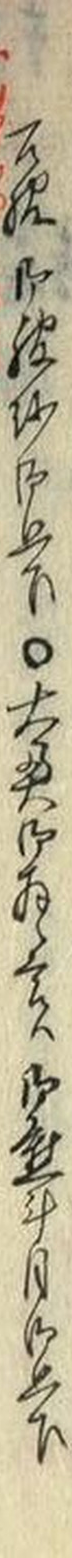召服御服紗御上下〇大奥御拝之節ハ御熨斗目御上下
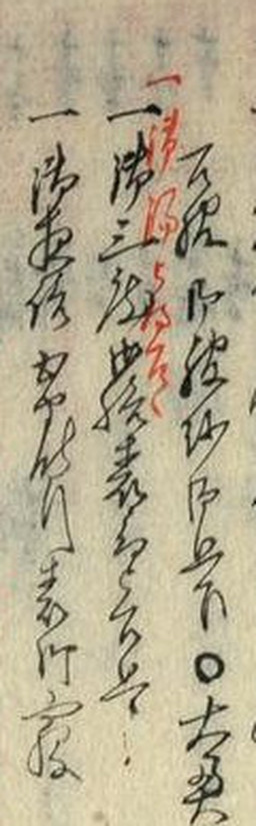一御三度御膳表ニ而被召上候
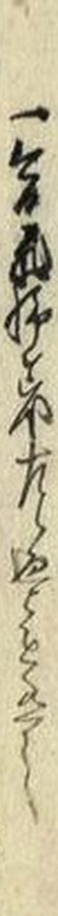一今日飛脚着左之通被進有之
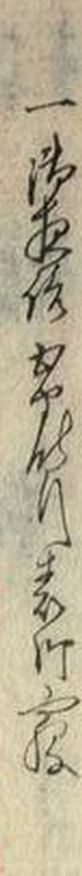一御夜詰五半時引表御寝
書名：少傅日録抄（斉承付側向頭取日記、在国）
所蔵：福井県文書館 Fukui Prefectural Archives
